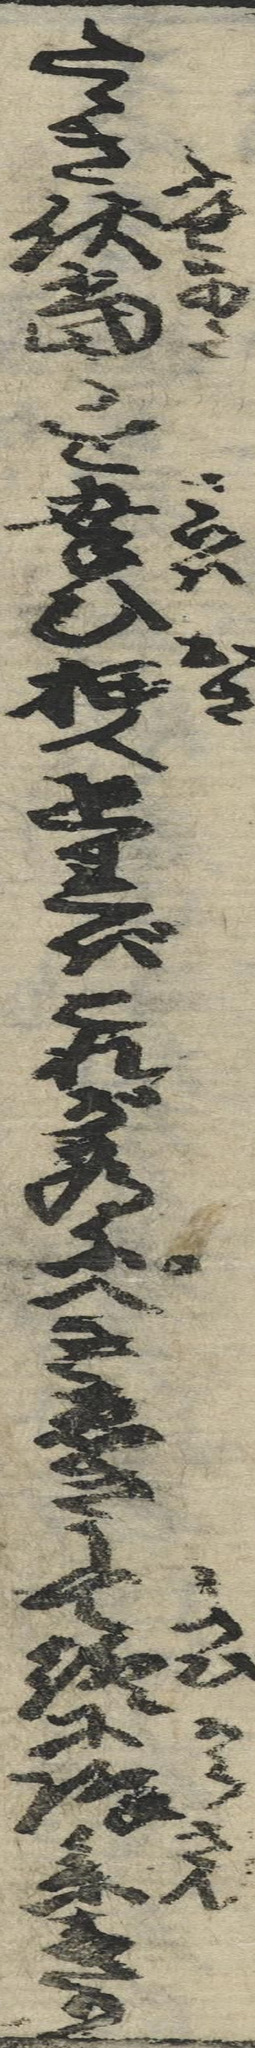たたき伏当るを幸ひ押へ上ればこれが為に。へきゑきして終に降参れり
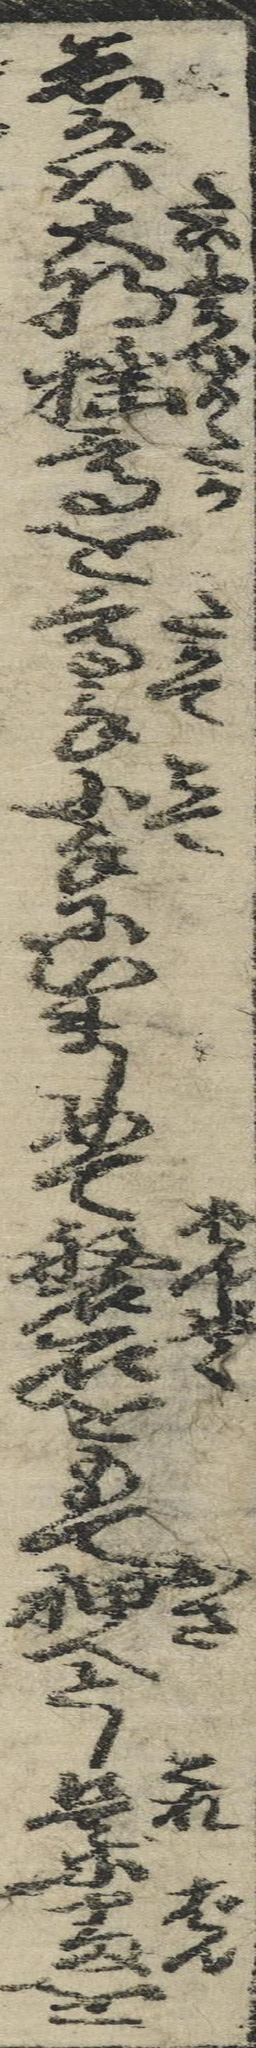しかば大将揺高を高手小手にいましめて磐石をもて押へとし是に番を
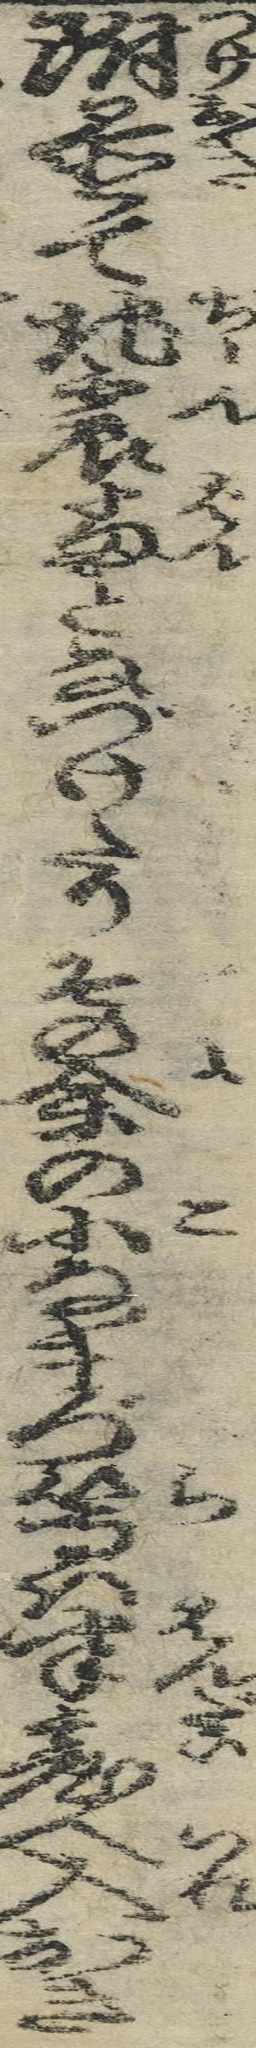附置て地震番となづけたりその余の小なまづ等は半台へ入おき
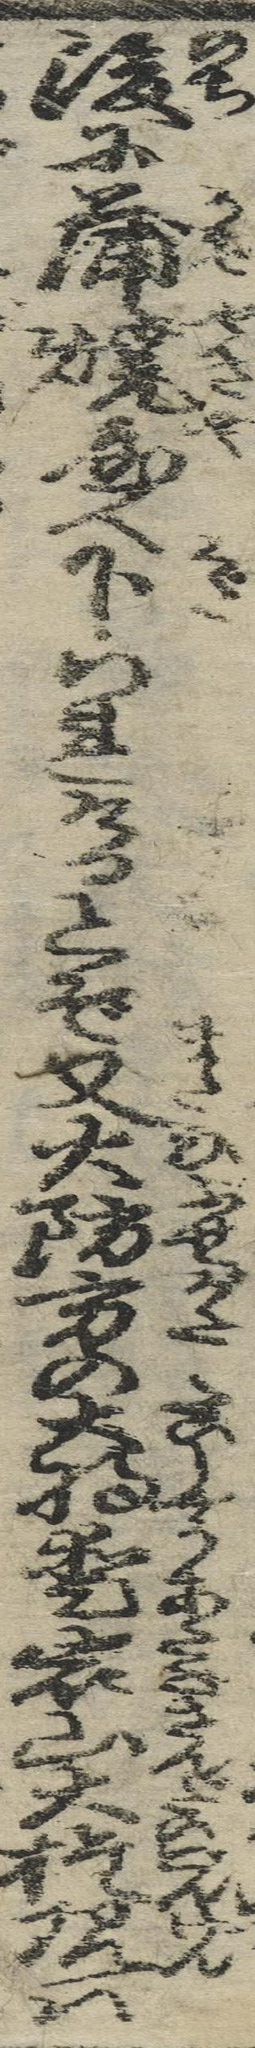後に蒲焼屋へ下はれけるとぞ又火防方の大将愛宕山大権現は
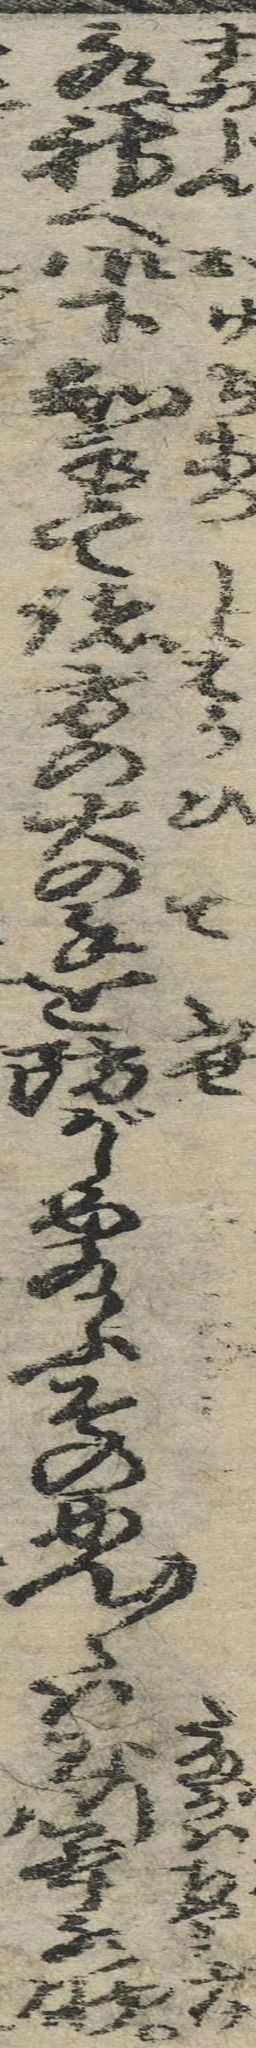水神へ御下知有て諸方の火の手を防がしめにふそのめん〳〵は玉川茶水助。
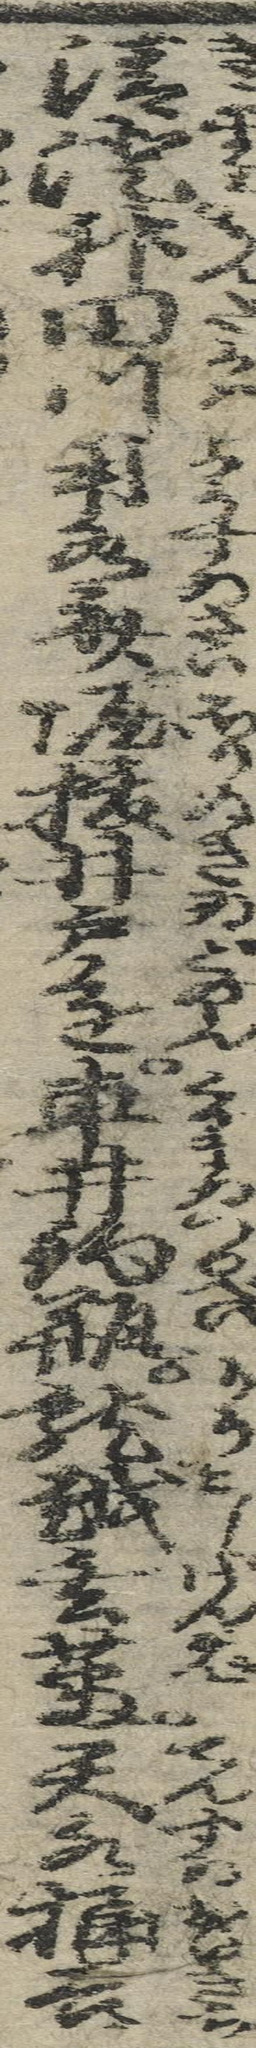清澄神田川用水斎堀抜井戸進。車井釣瓶。龍越玄番。天水桶吉
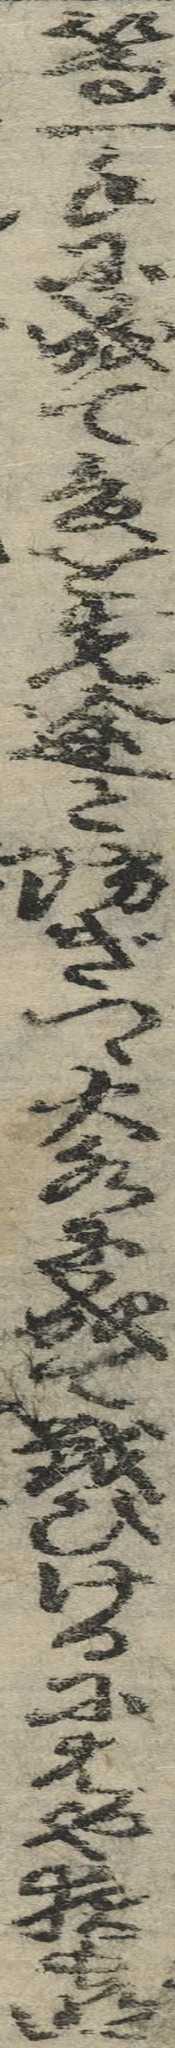等。一手に成て爰を先途を防ぎつつ火水に成て戦ひけるにはや夜も明
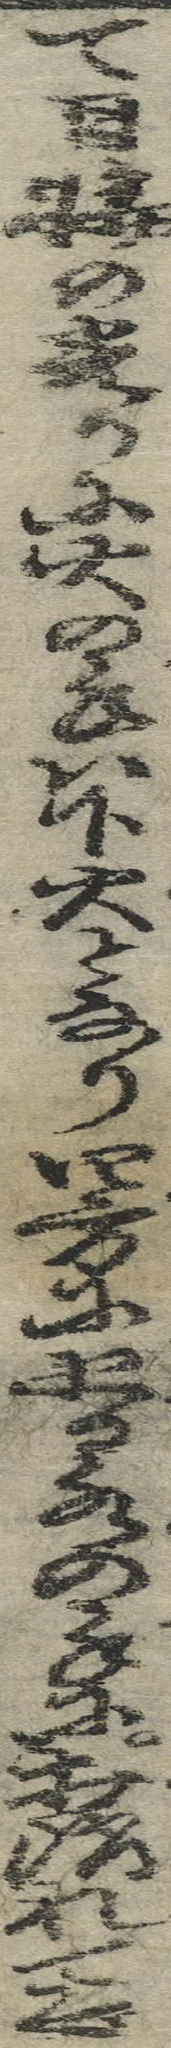て日輪の光りに火の手は下火となり四方に上る水の手に。打消れて石
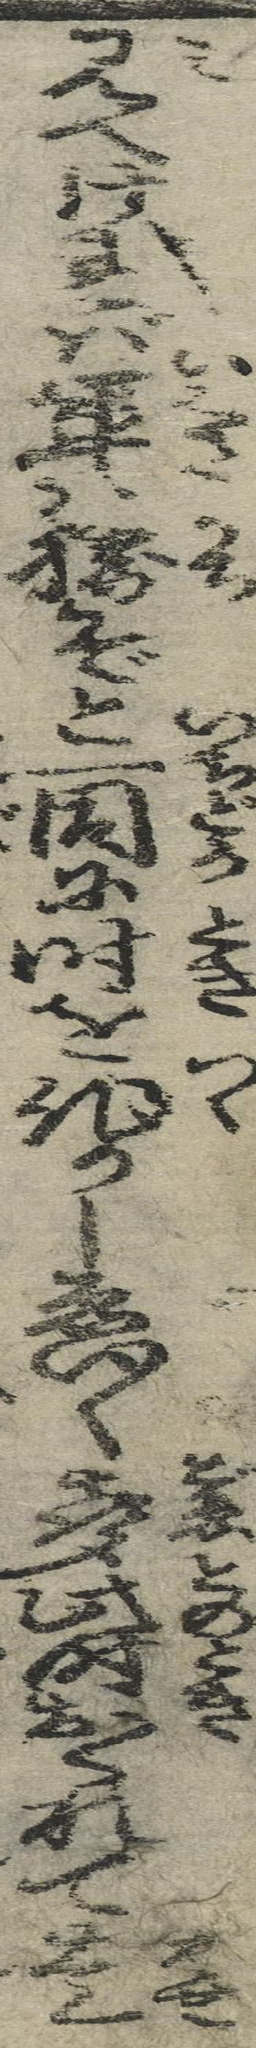見へければ軍は勝ぞと一同に時を作りしゑい〳〵声此時おくれて先
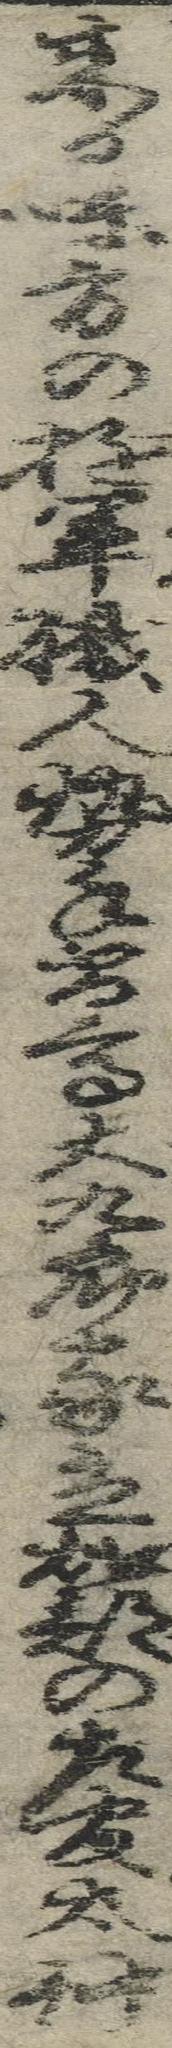来る味方の遊軍職人勢手間高大九郎家立。加部の左官太仲
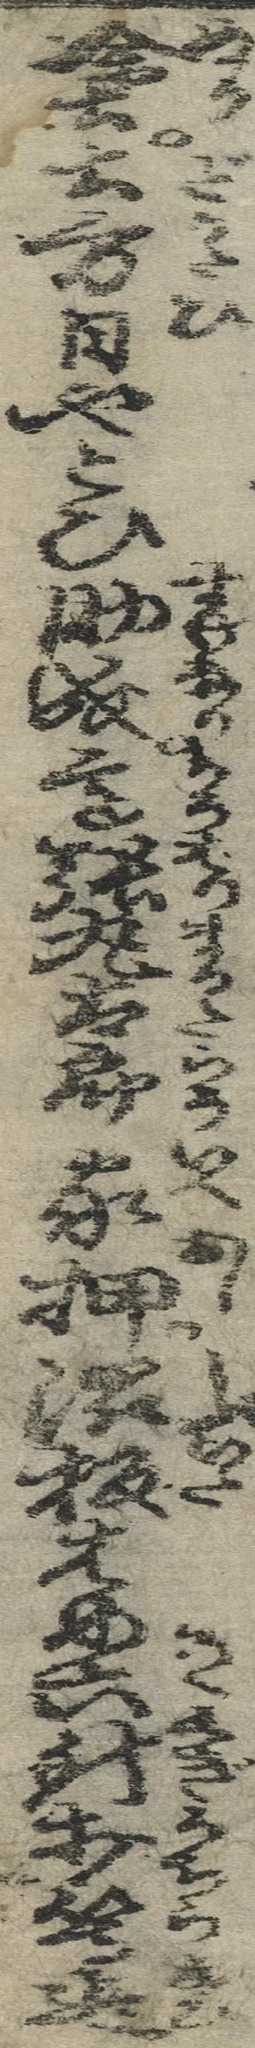塗。土方日やとひ助成。高張丸太郎家押。渋板はめ六釘打等追

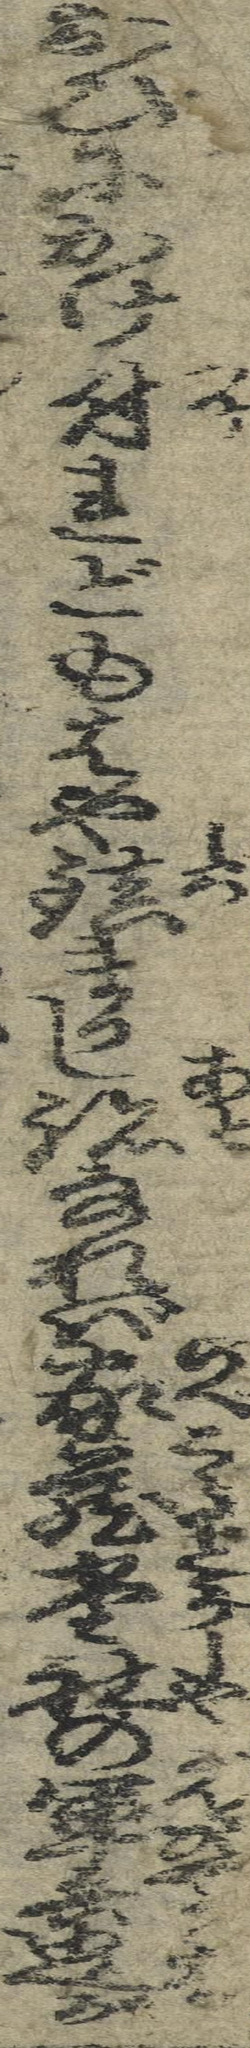おひにかけ付れどもはや鎮まりし跡なれば家蔵堂社の軍兵迪が
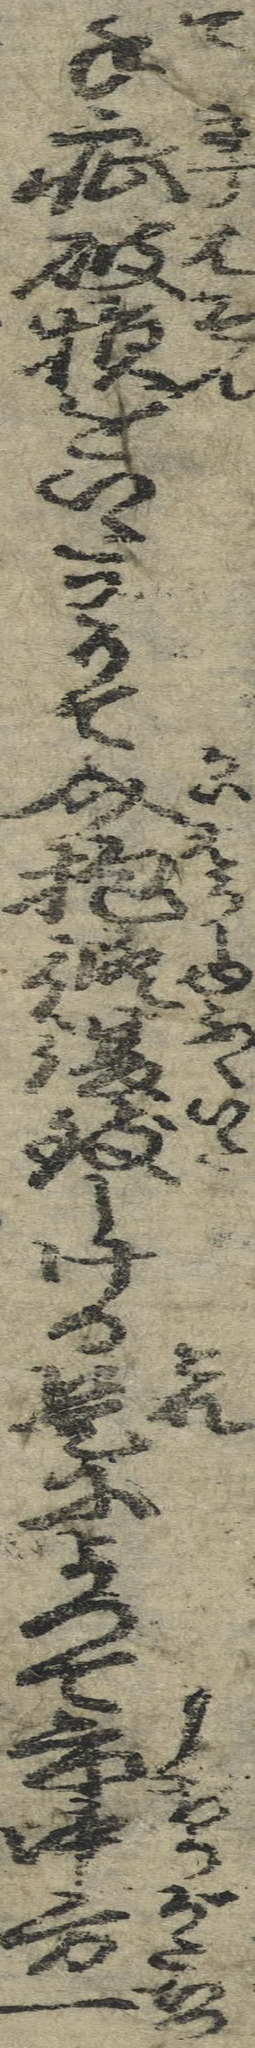手疵破損をいたわりて介抱修復致しける是によつて市中方一
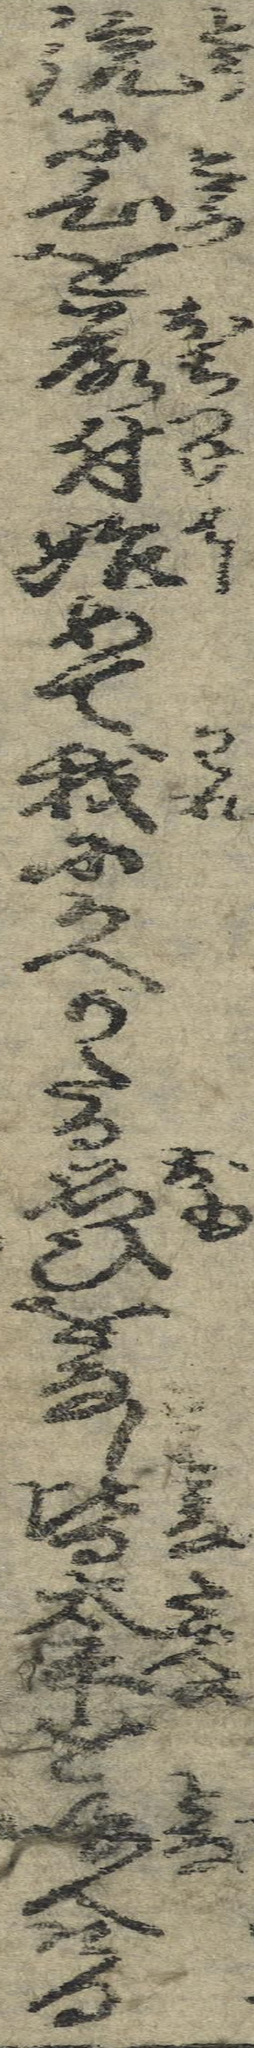統に心を落付始めて我にかへりたる思ひをなし皆太平を唱へける
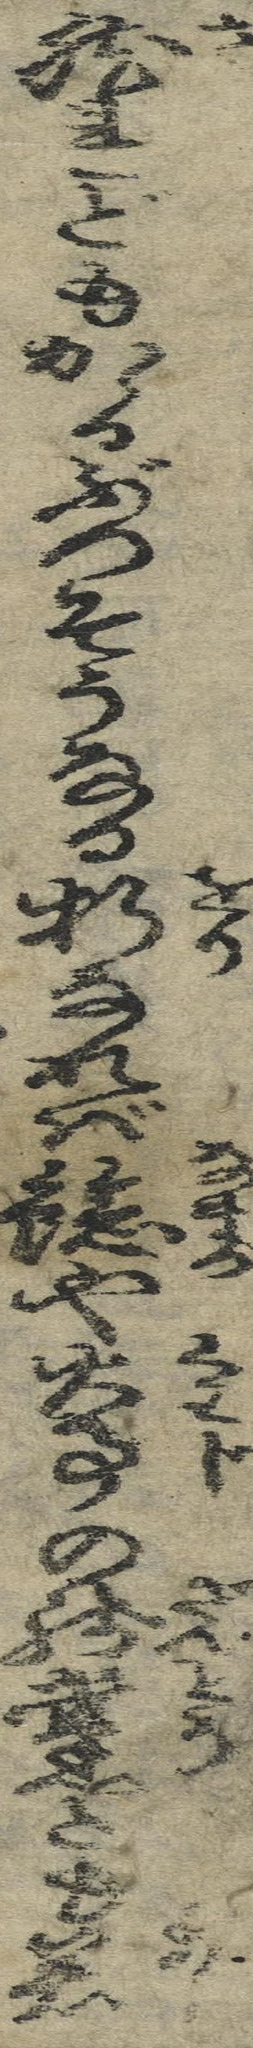然れどもかゝるぶつそうなる折なれば鯰や火事の残党ども若
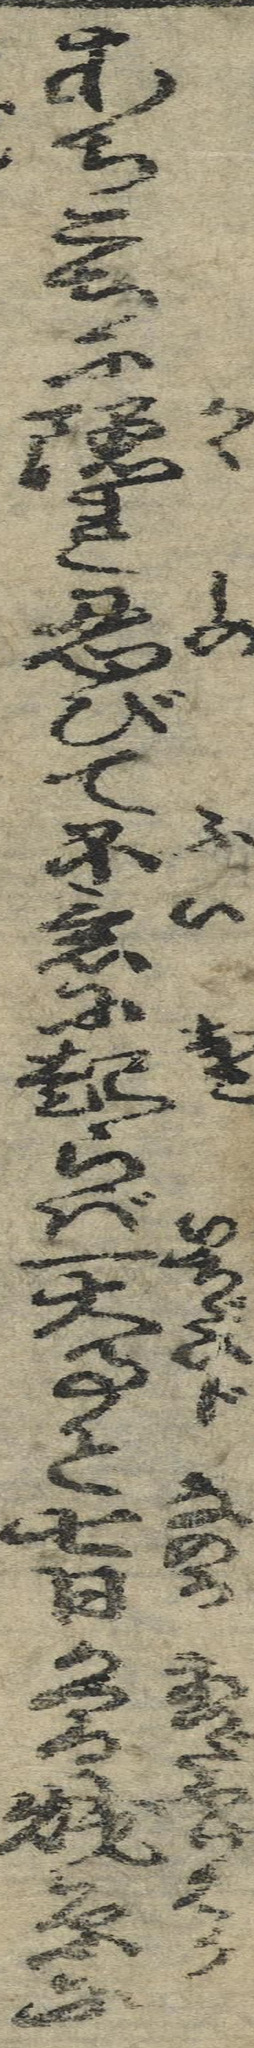あちこちに隠れ忍びて不意に起らば一大事と七日の間焼原に
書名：鯰太平記混雑ばなし
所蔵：東京大学地震研究所図書室 Earthquake Research Institute Library, The University of Tokyo, JAPAN
